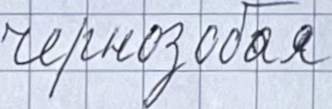чернозобая
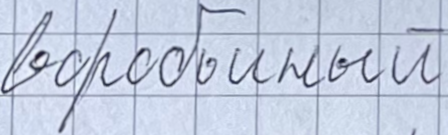воробьиный
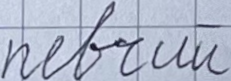певчий
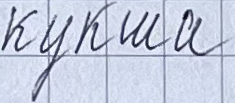кукша
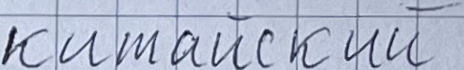китайский
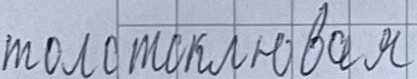толстоклювая
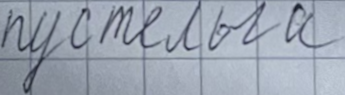пустельга
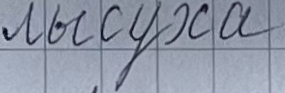лысуха
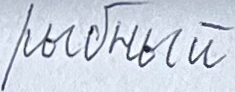рыбный
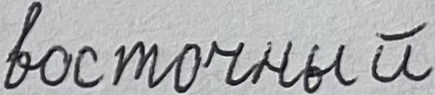восточный
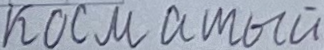косматый
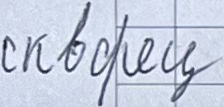скворец
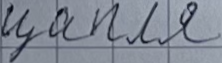цапля
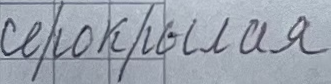серокрылая
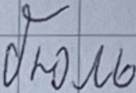бюль
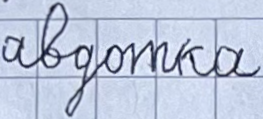авдотка
